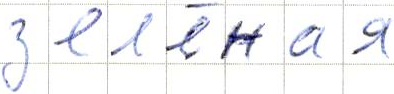зелёная
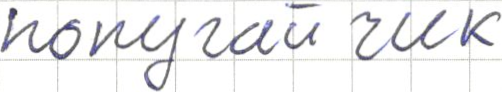попугайчик
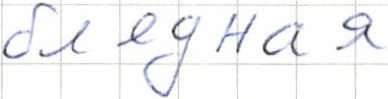бледная
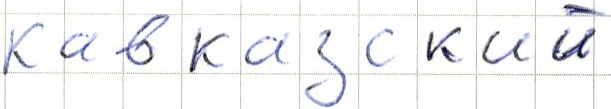кавказский
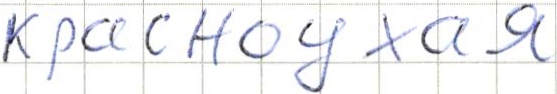красноухая
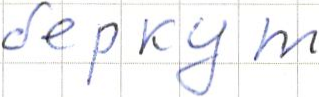беркут
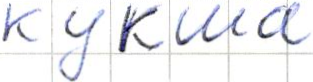кукша
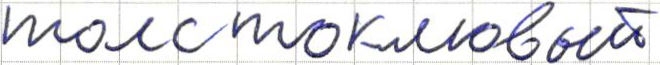толстоклювый
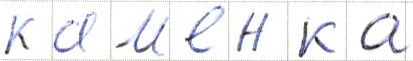каменка
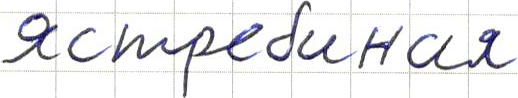ястребиная
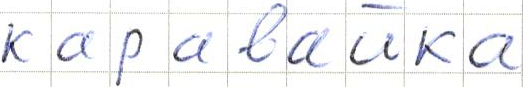каравайка
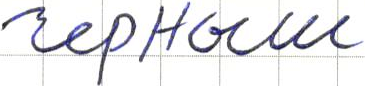черныш
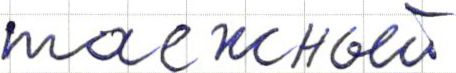таежный
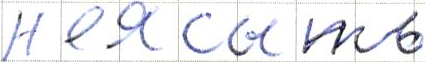неясыть
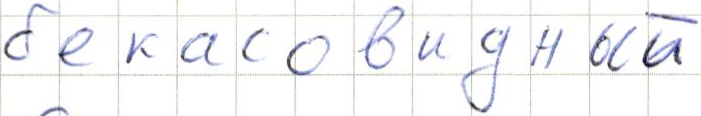бекасовидный
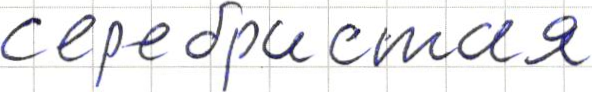серебристая
